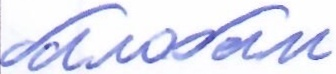балобан
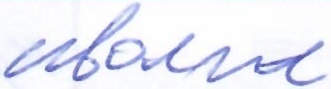иволга
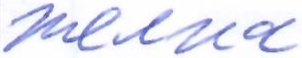желна
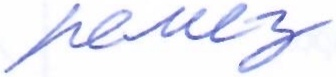ремез
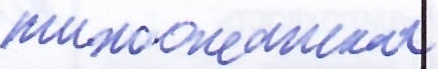тихоокеанская
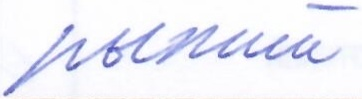рыжий
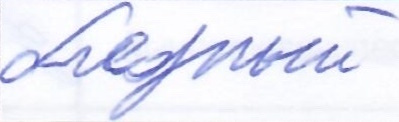бледный
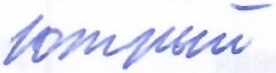южный
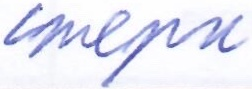стерх
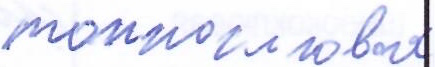тонкоглювая
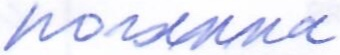поганка
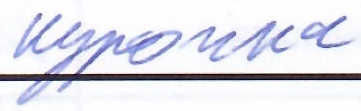курочка
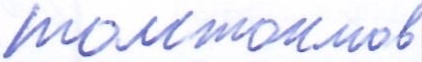толстоклюв
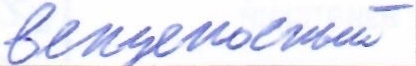венценосный
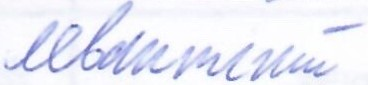левантский
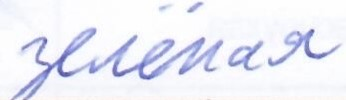зелёная
